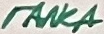галка
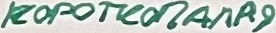короткопалая
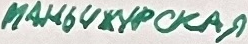маньчжурская
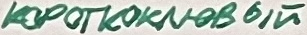короткоклювый
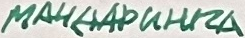мандаринка
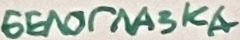белоглазка
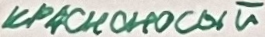красноносый
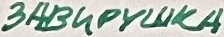завирушка
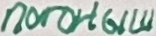погоныш
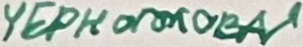черноголовая
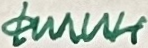филин
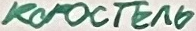коростель
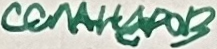соландров
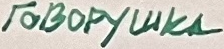говорушка
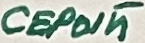серый
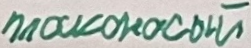плосконосый
